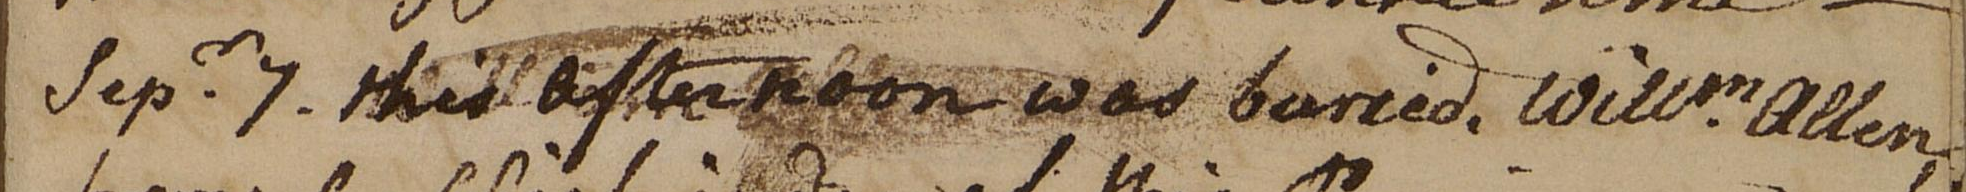Sep^r. 7. this afternoon was buried. Will^m. Allen
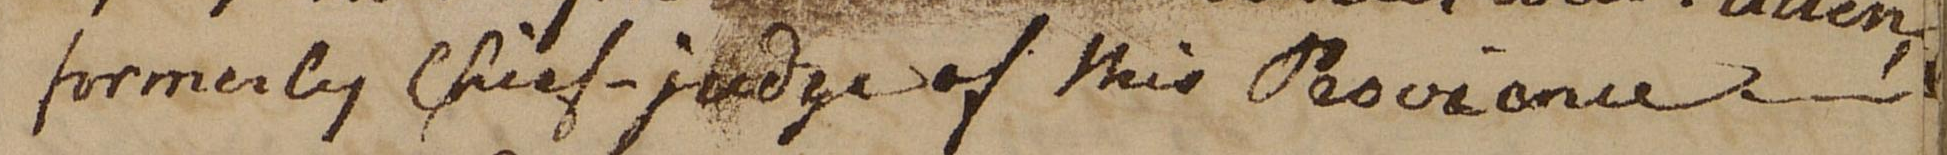formerly Chief-judge of this Provience-
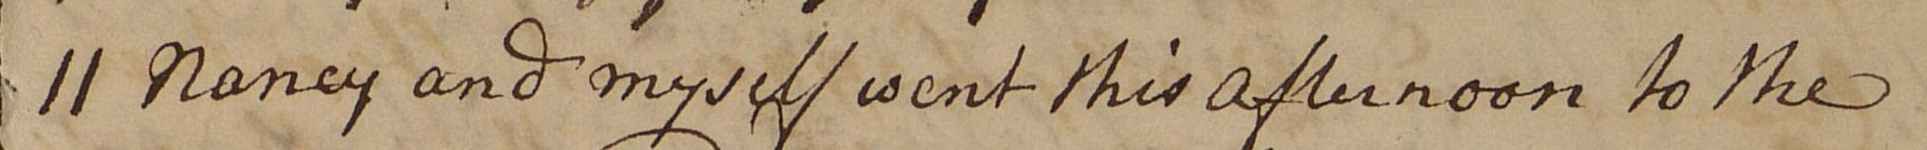11 Nancy and myself went this afternoon to the
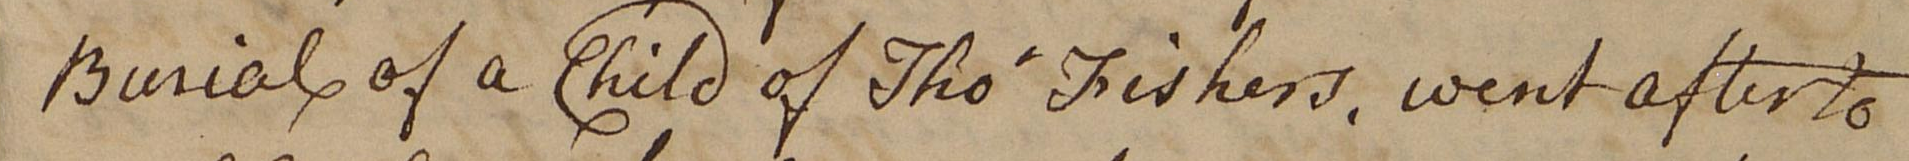Burial of a Child of Tho^s Fishers, went after to
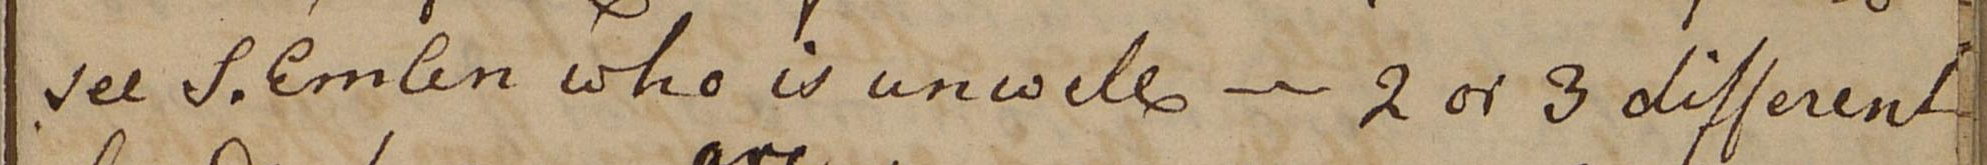see S. Emlen who is unwell- 2 or 3 different
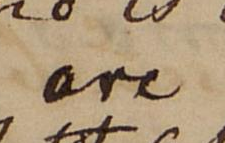are
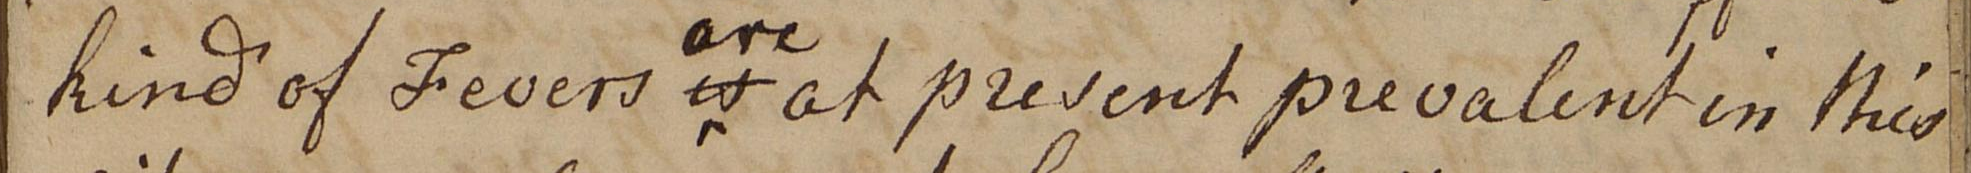kind of Fevers is ^ at present prevalent in this
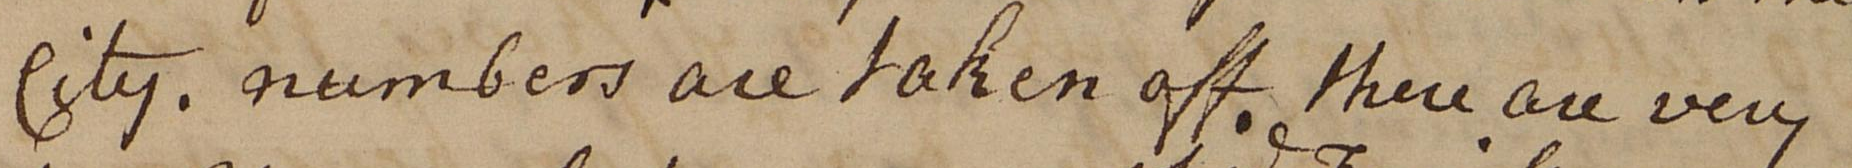City. numbers are taken off, there are very
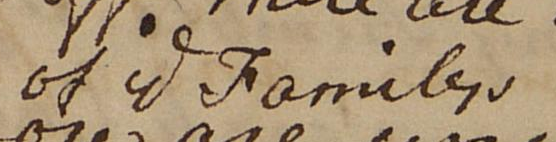of y^e Familys
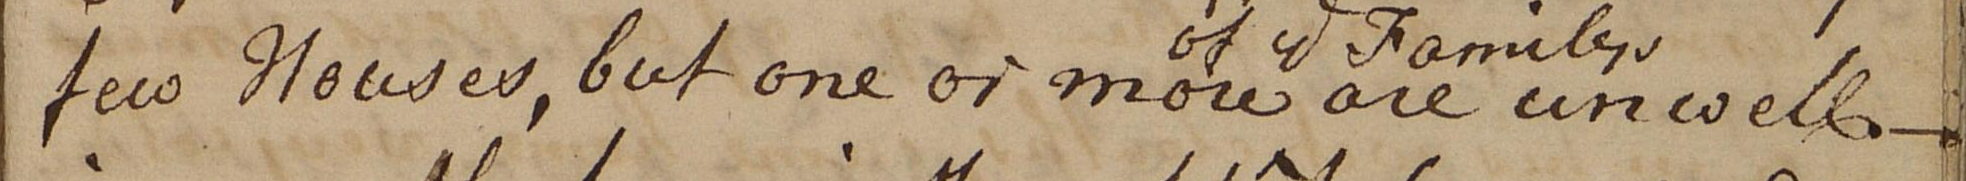few Houses, but one or more are unwell-
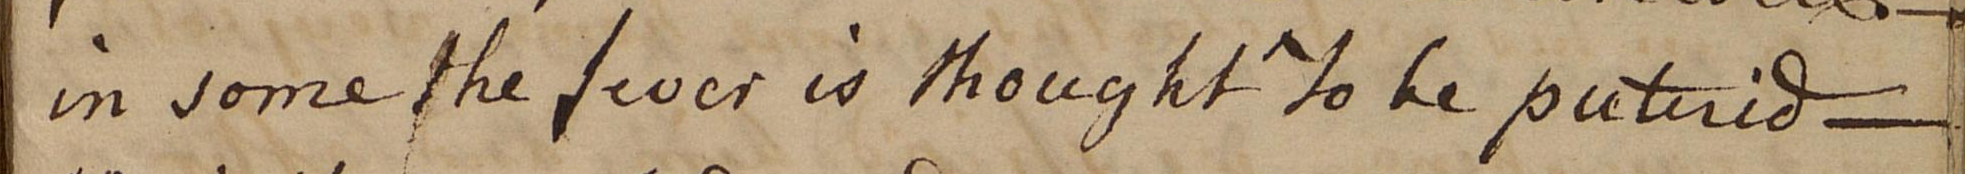in some the fever is thought to be putirid-
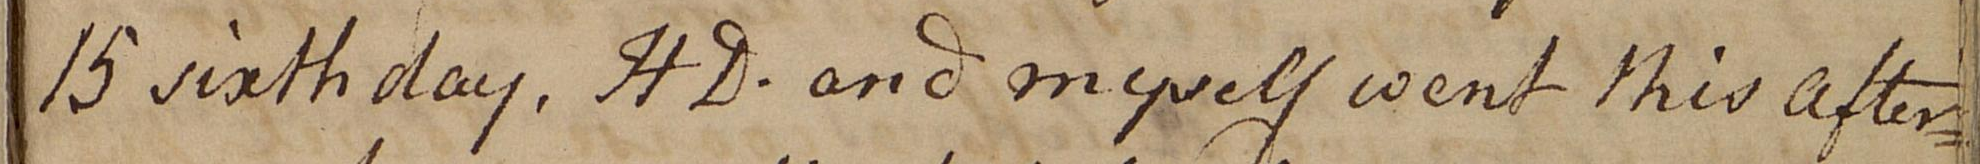15 sixth day. HD. and myself went this after-
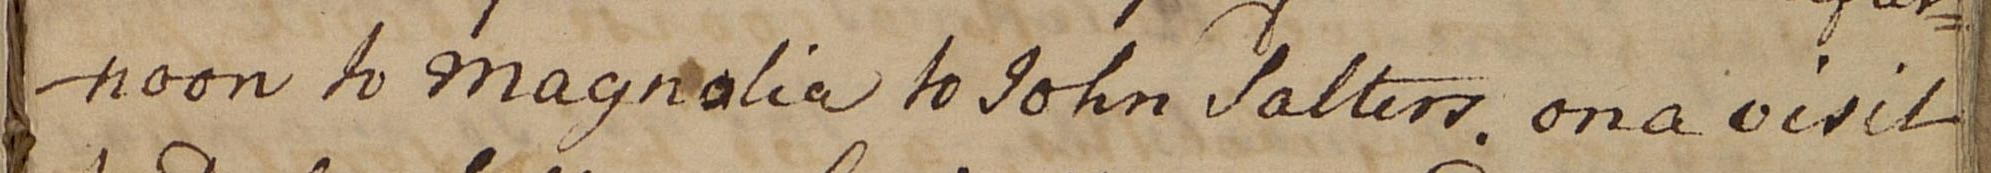-noon to Magnolia to John Salters, on a visit
